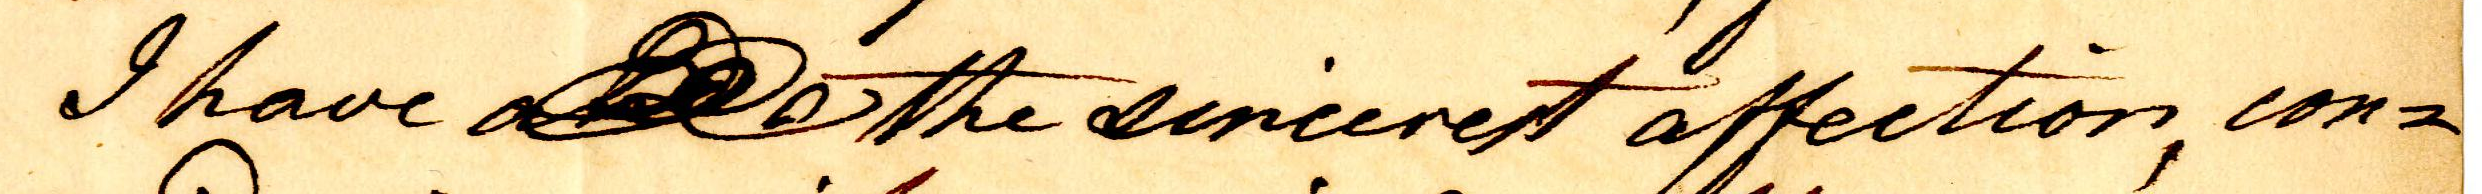I have [____] the sincerest affection, con-
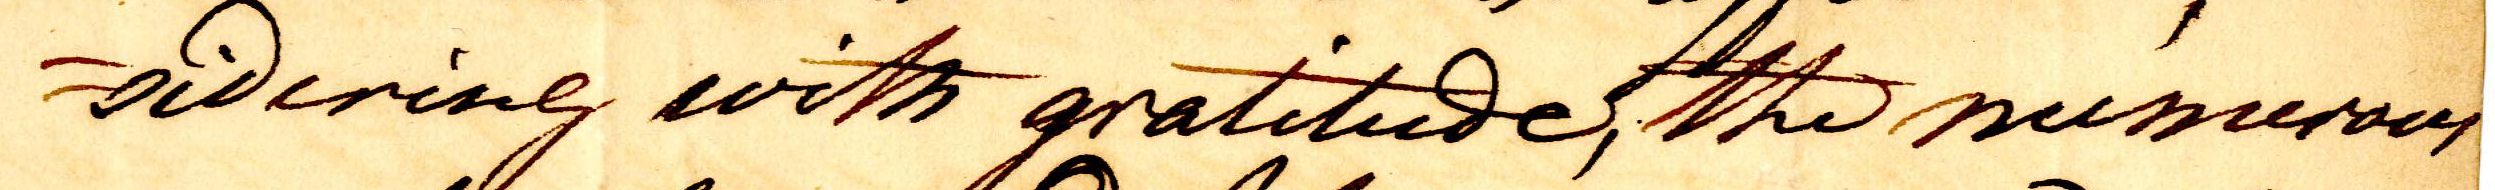-sidering with gratitude, the numerous
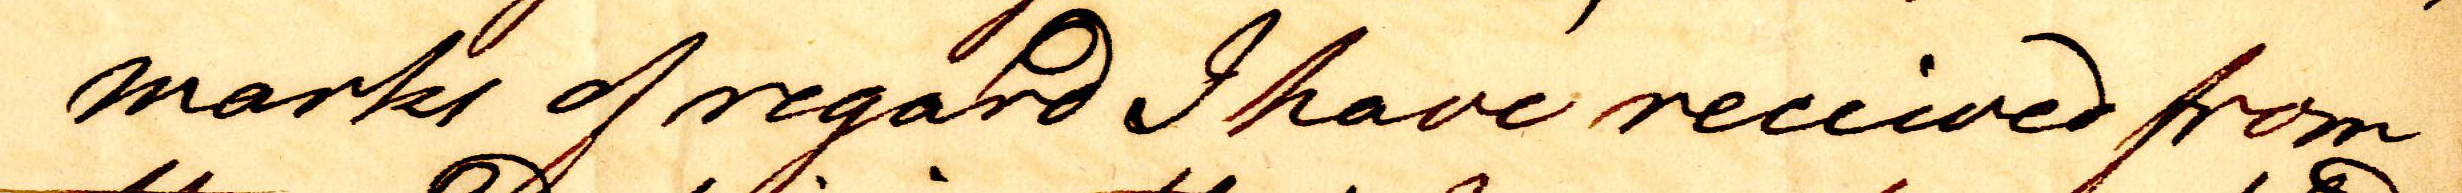marks of regard I have received from
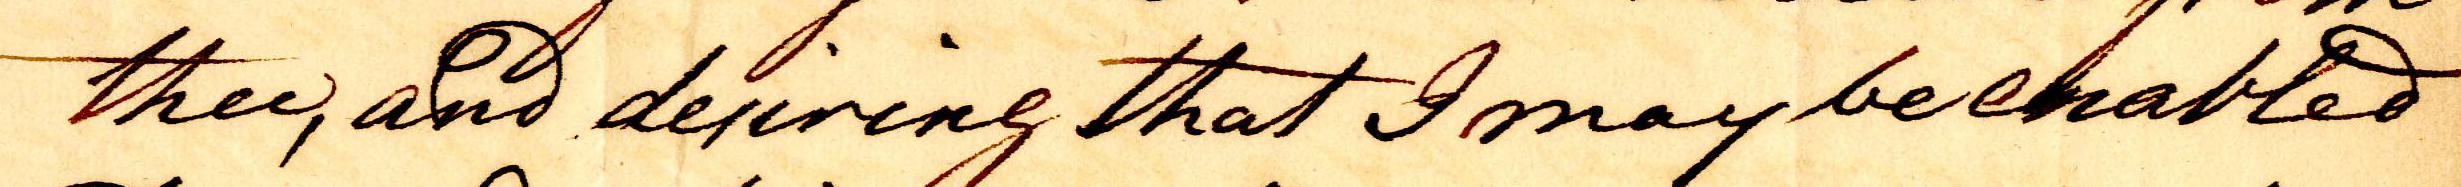thee, and desiring that I may be enabled
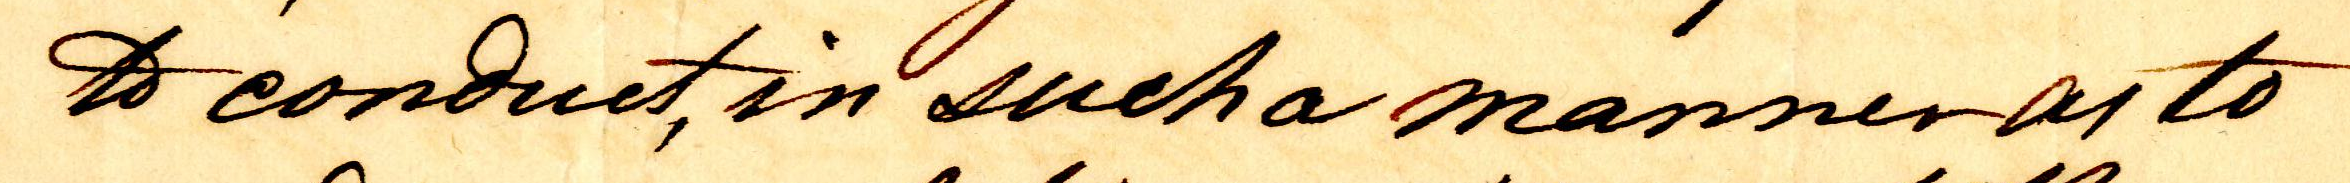to conduct, in such a manner as to
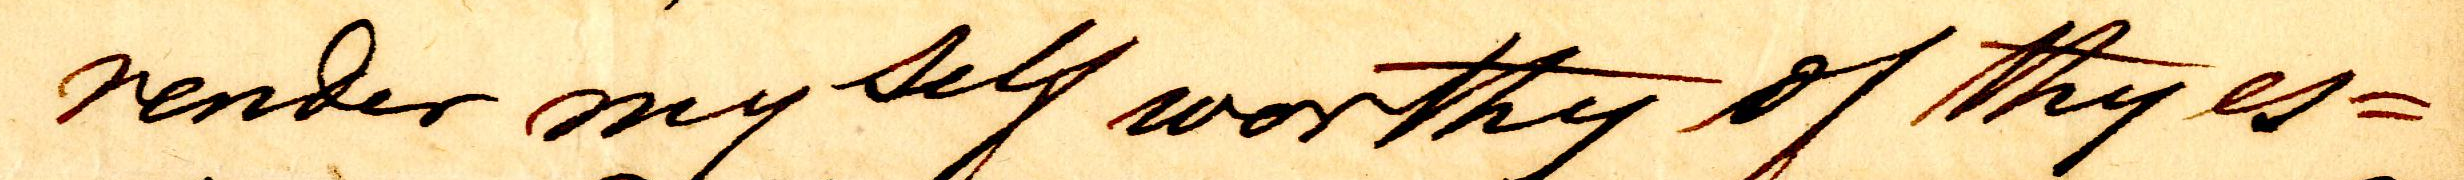render my self worthy of thy es-
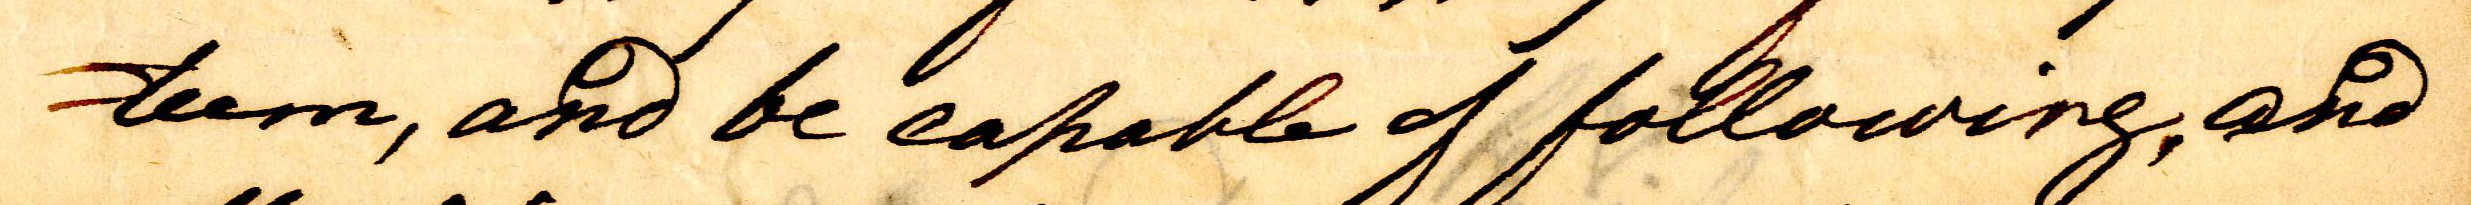-teem, and be capable of following, and
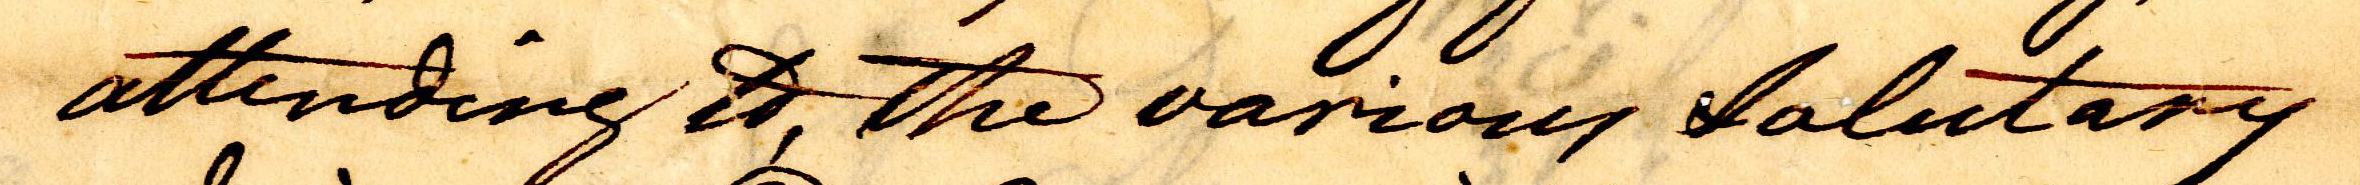attending to, the various salutary
